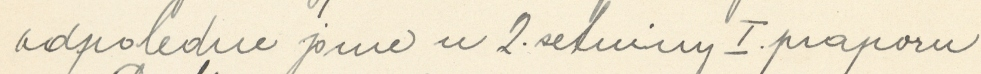odpoledne jsme u 2. setniny I. praporu
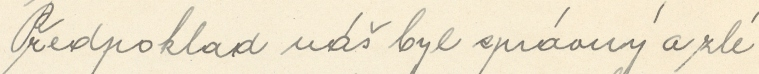Předpoklad náš byl správný a zlé
